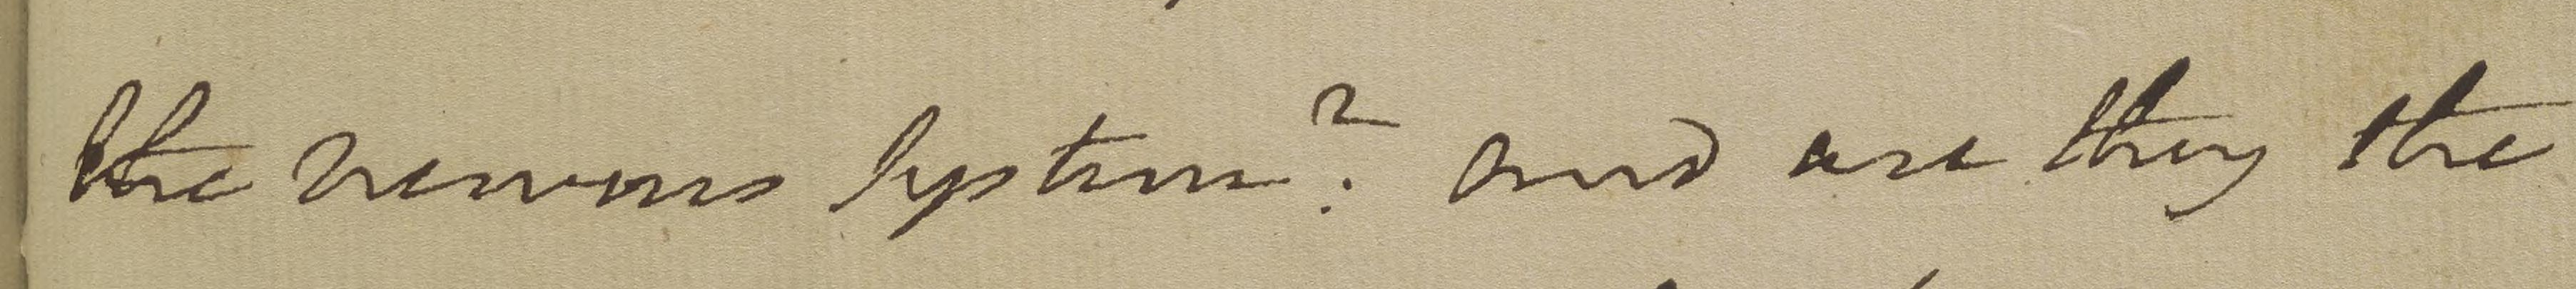the nervous system? and are they the
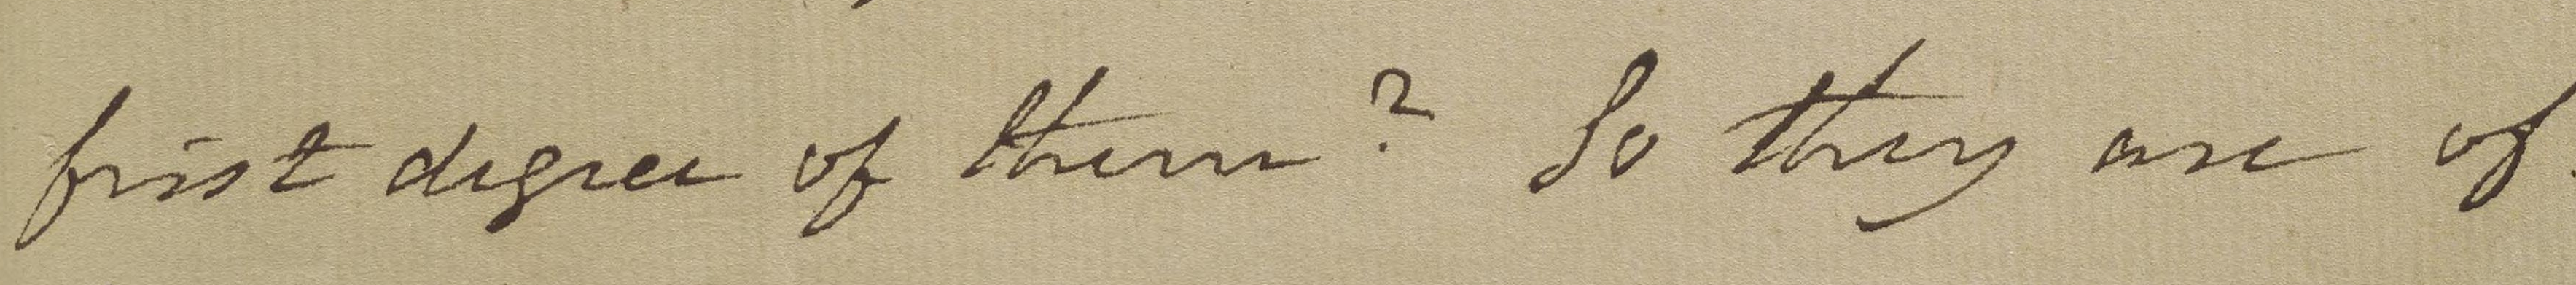first degree of them? So they are of
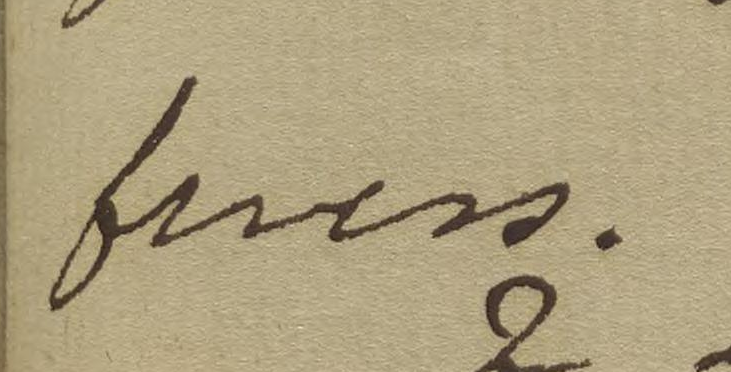fevers.
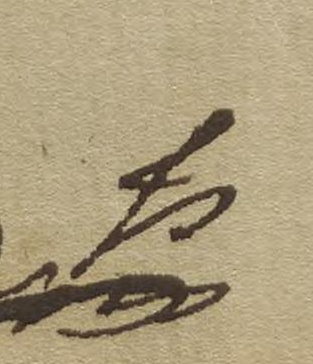Is
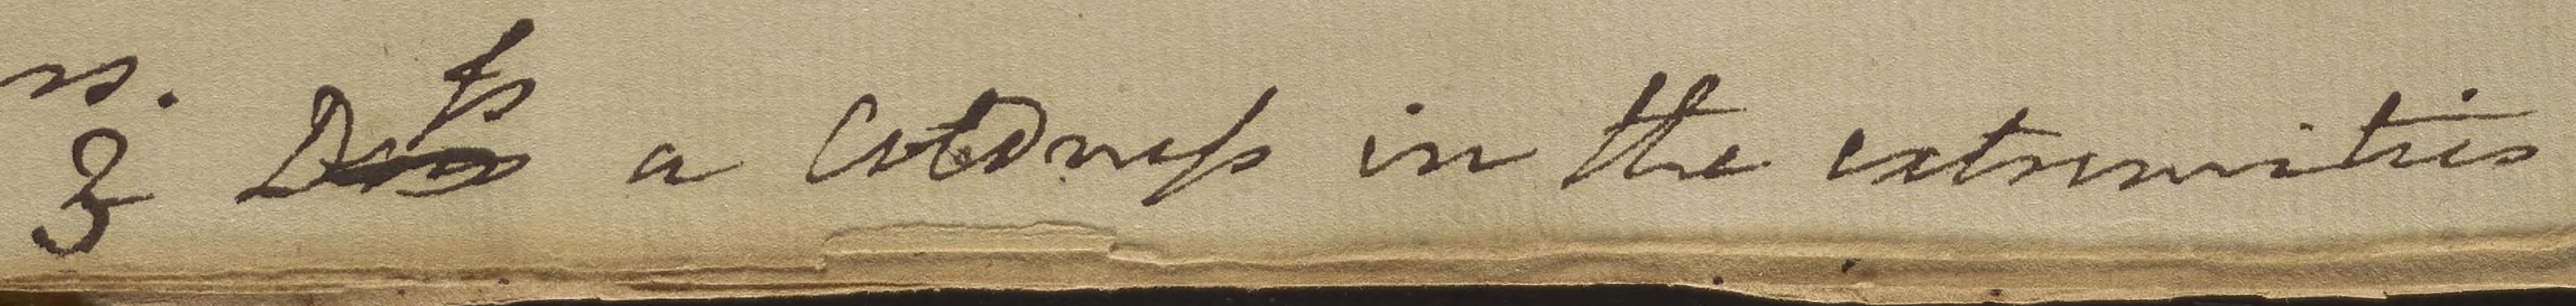3 [Does] a coldness in the extremities
